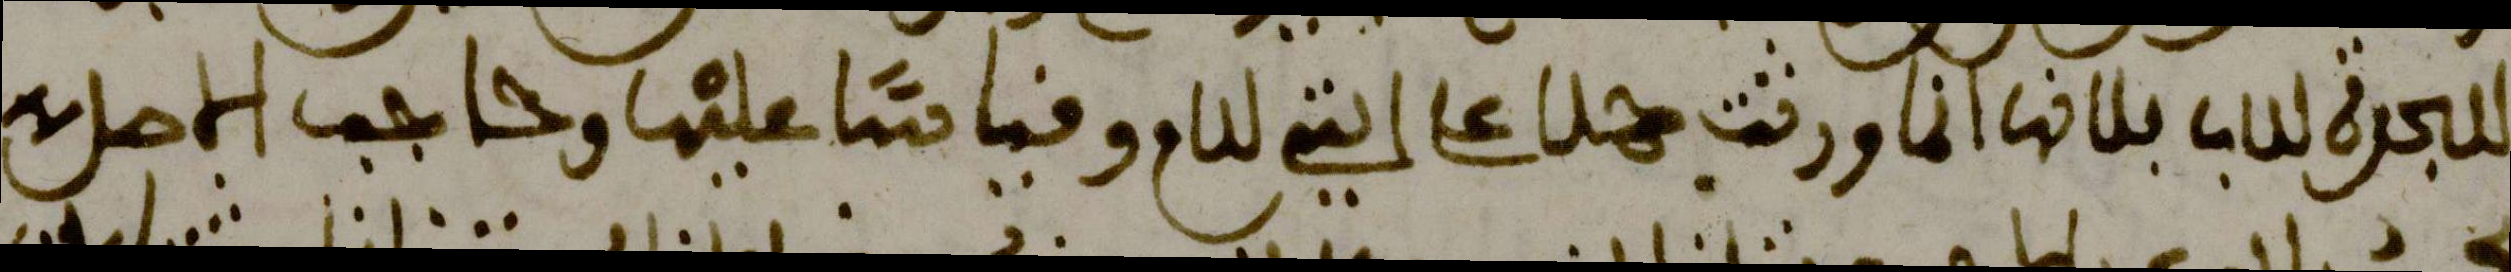للجدة للاب فلانها انما ورثت حملا على التي للام وقياسا عليْها وحاجب الاصل
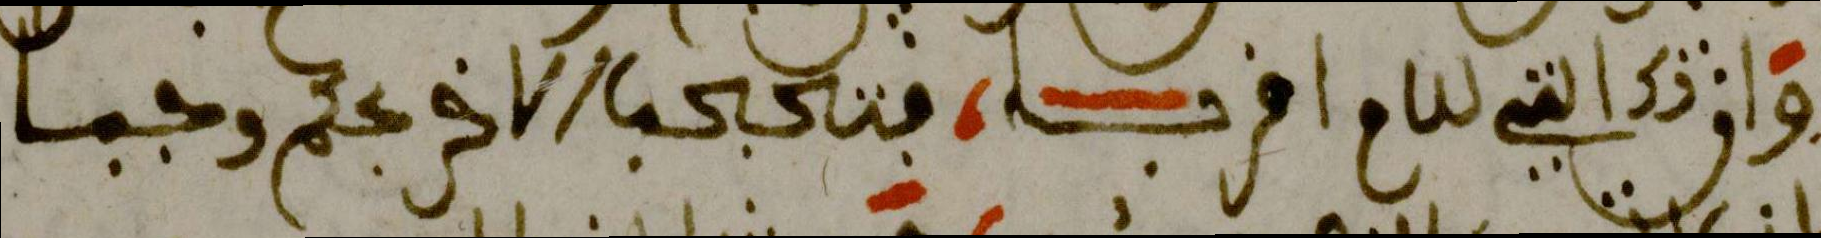وان تك التي للام اقربا فتحجب الاخر بحكم وجبا
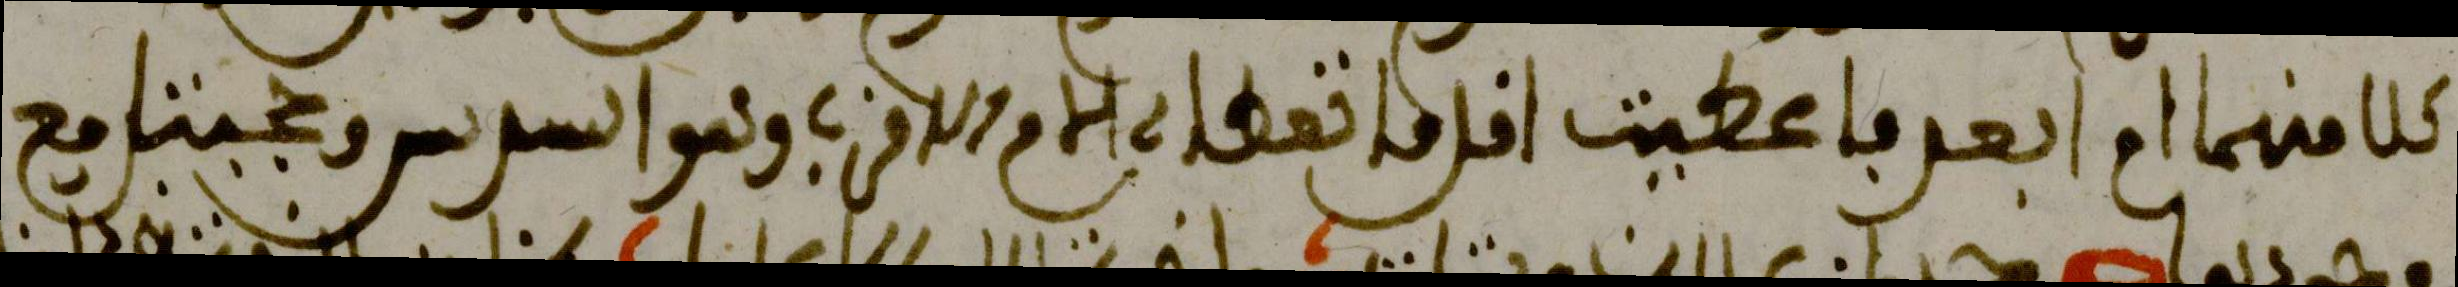كلا منهما ام ابعد فاعطيت اقل ما تعطاه الام الاقرب وهو السدس وحجبتا مع
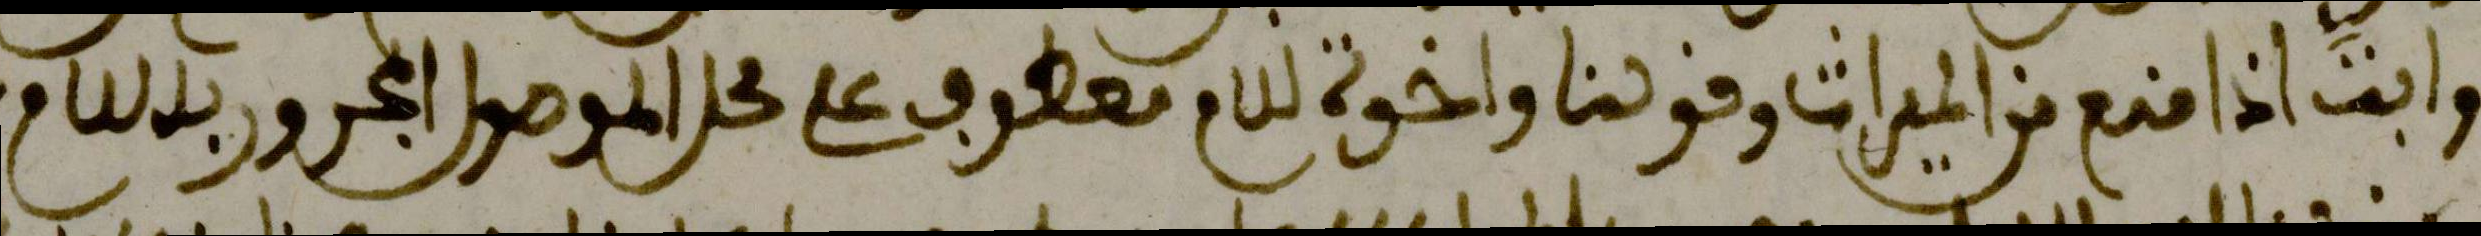وابت اذا منع من الميراث وقولنا واخوة للام معطوف على محل الموصول المجرور باللام
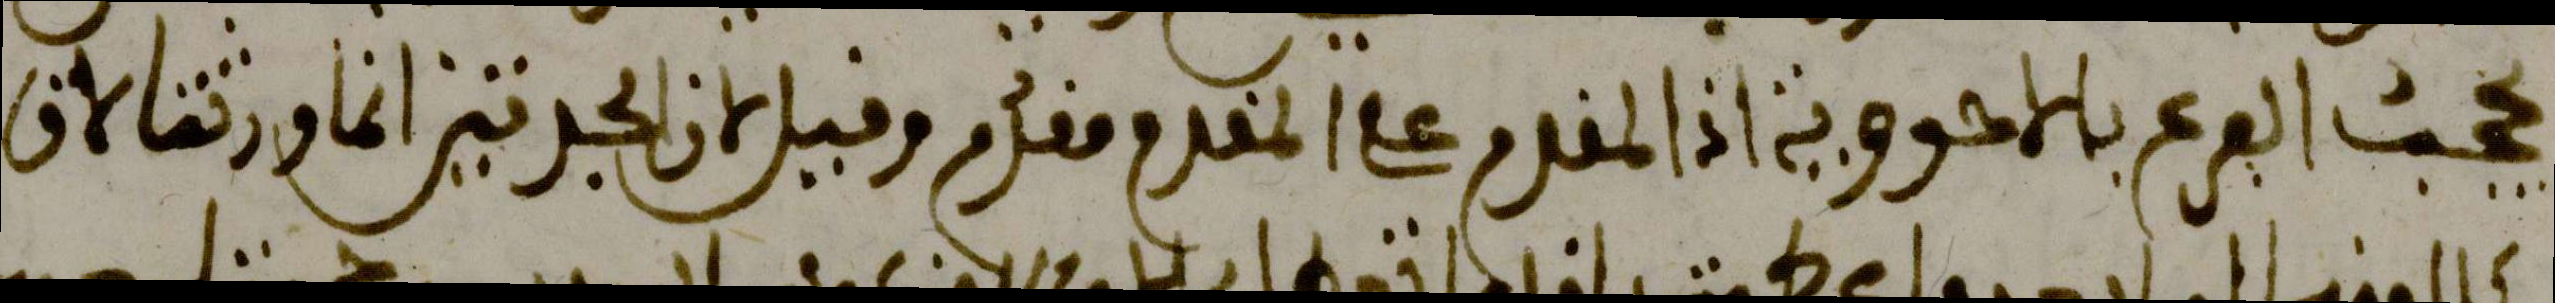يحجب الفرع بالاحروية اذا المقدم على المقدم مقدم وقيل لان الجدتين انما ورثتا لان
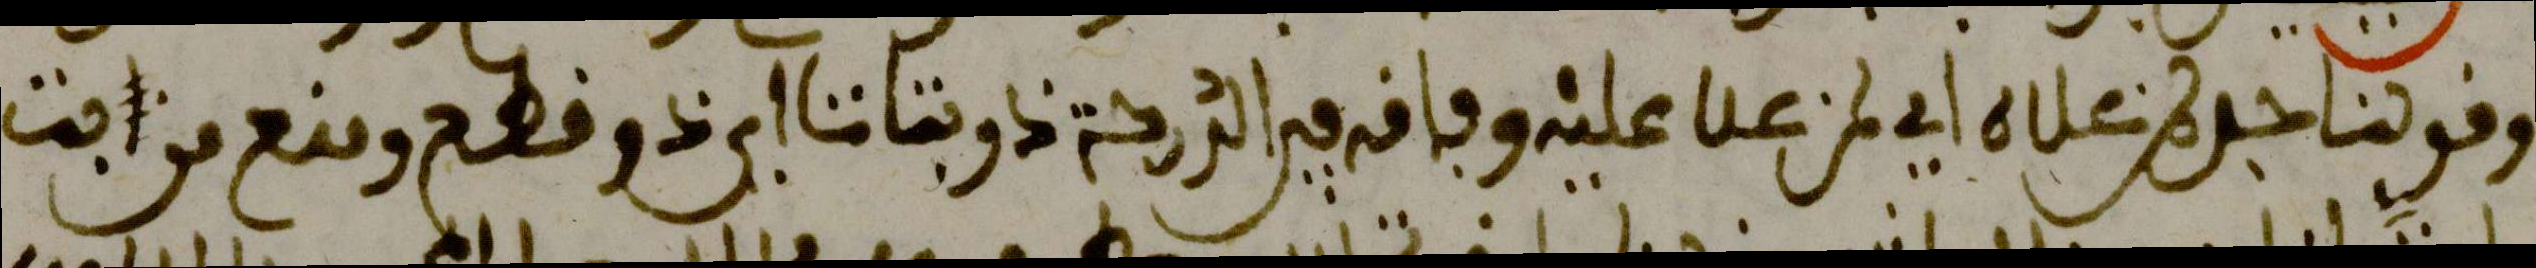وقولنا جد لمن علاه اي علا عليْه وفاقه في الدرحة ذو بتات اي ذو قطع ومنع من ابت
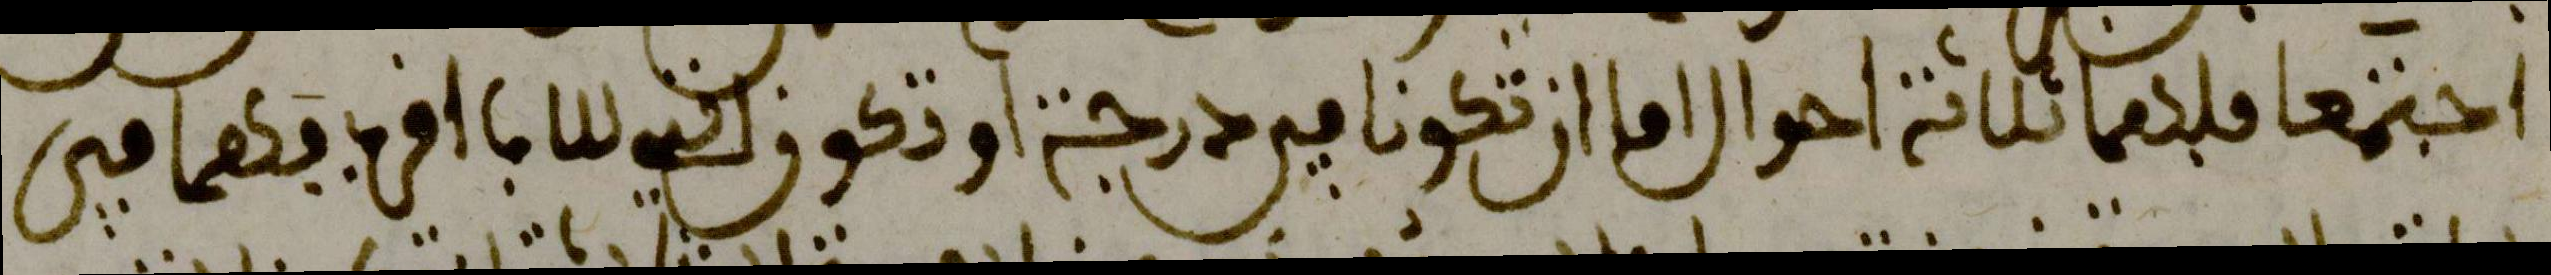اجتمعا فلهما ثلاثة احوال اما ان تكونا في درجة او تكون التي للاب اقرب فهما في
